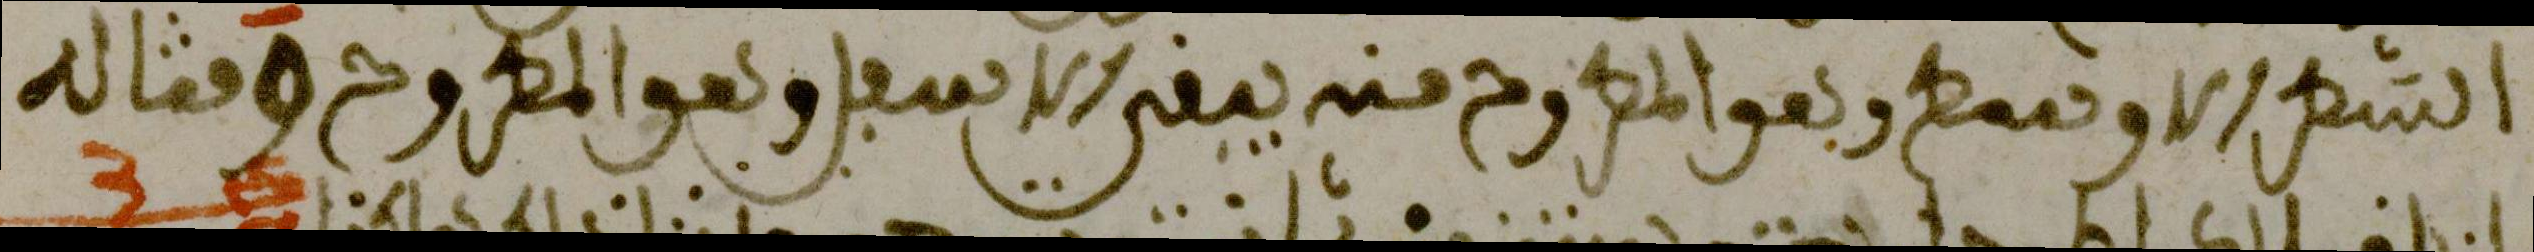السّطر الاوسط وهو المطروح منه يبقى الاسفل وهو المطروح وَمثاله
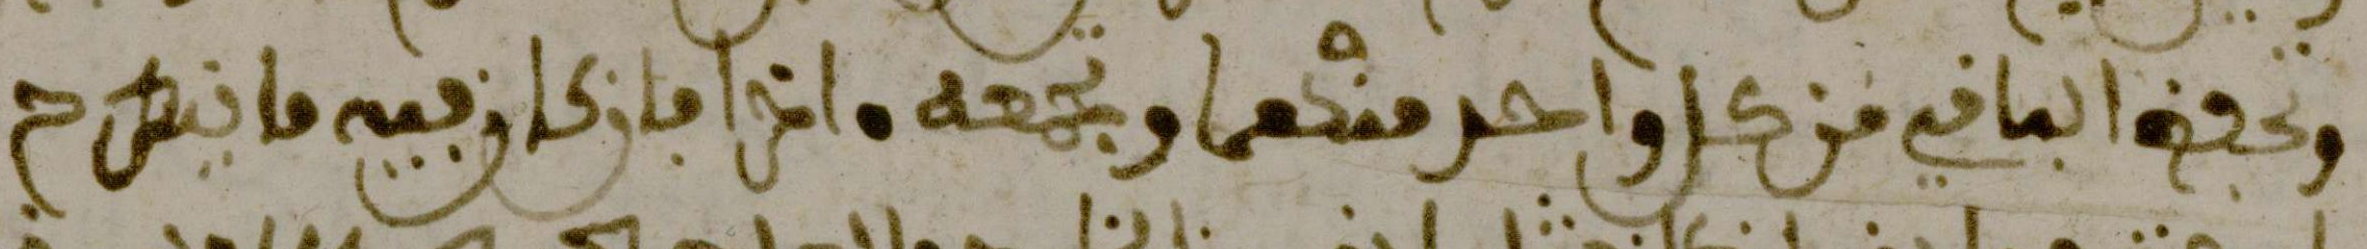و تحفض الباقي من كل واحد منهما و تجمعه ءاخرا فان كان فيه ما ينطرح
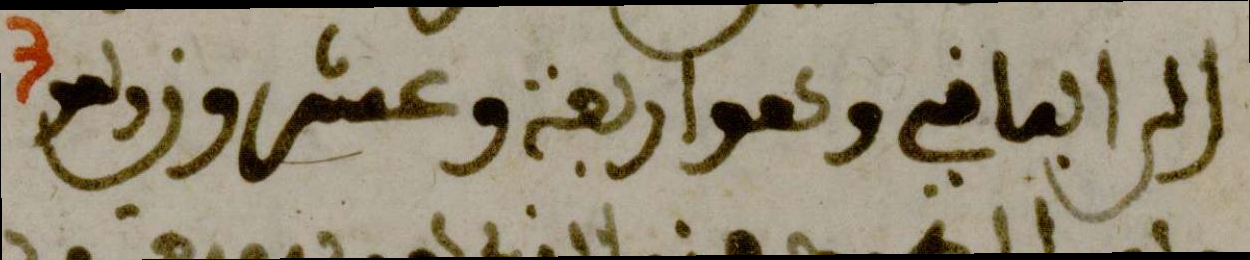الى الباقي و هو اربعة و عشرون وهو
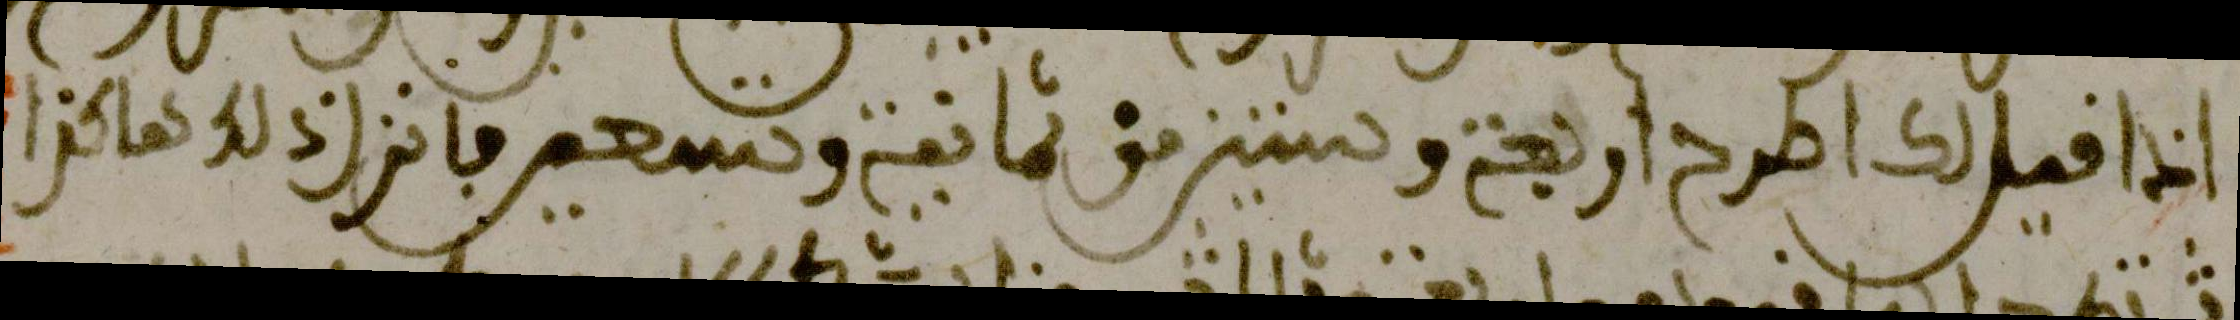اذا قيل لك اطرح اربعة و ستين من ثمانية و تسعين فانزل ذلك هاكذا
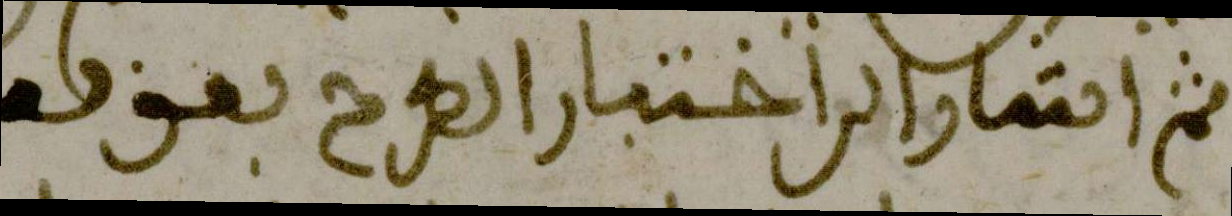ثم أشار الى اختبار الطرح بقوله
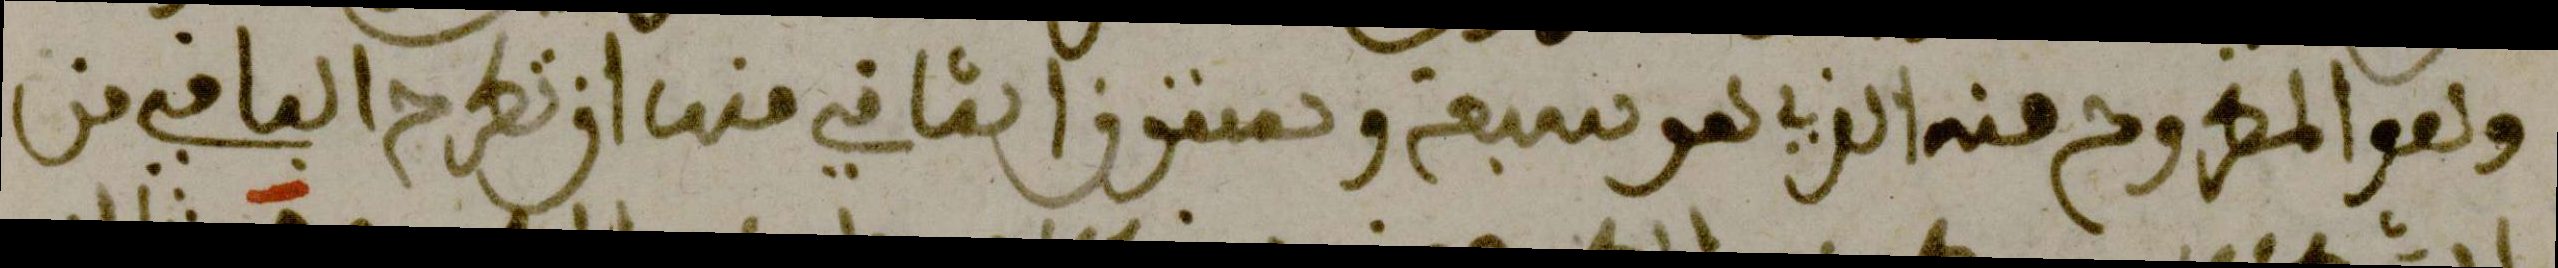وهو المطروح منه الذي هو سبعة وستون الثاني منه ان تطرح الباقي من
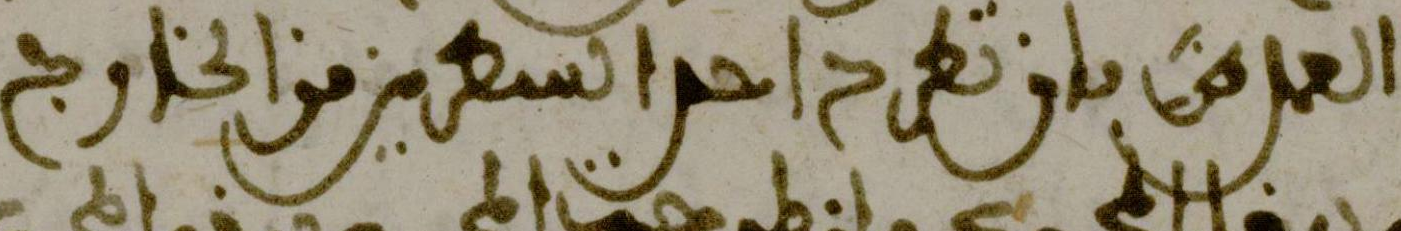العمل من فان تطرح احد السطرين من الخارج
